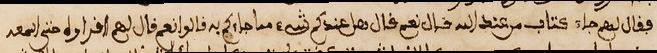فقال لهم جاء كتاب من عند الله قال نعم قال هل عندكم شىء مما جاءكم به قالوا نعم قال لهم اقراوه حتى اسمعه
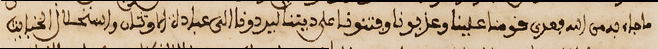ما جاء به من الله فعرى قومنا علينا وعزبونا وفتنونا على ديننا ليردونا الى عبادة الاوثان واستحلال الخبايث
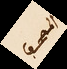المصحف
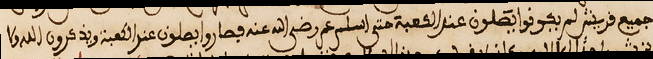جميع قريش لم يكرنوا يصلون عند الكعبة حتى اسلم عمر رضى الله عنه فصاروا يصلون عند الكعبة ويذكرون الله ولا
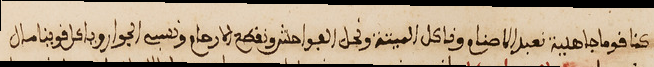كنا قوما جاهلية نعبد الاصنام وناكل الميتة نحل الفواحش ونقطع الارحام ونسبى الجوار وياكل قوينا مال
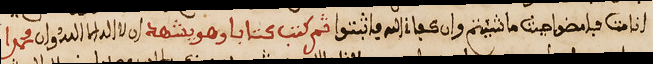انا مت فامضوا حيث ما شيتم وان كفانى الله فاثبتوا ثم كتب كتابا وهو يشهد ان لا اله الا الله وان محمدا
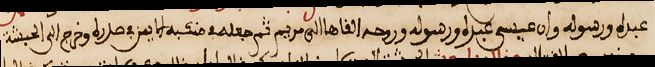عبده ورسوله وان عيسى عبده ورسوله وروحه القاها الى مريم ثم جعله في منكبه الايمن في صرره وخرج الى الحبشة
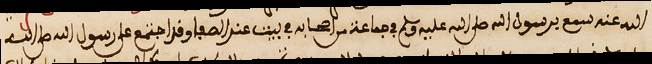الله عنه سمع برسول الله صلى الله عليه وسلم في جماعة من اصحابه في بيت عند الصفا وقد اجتمع على رسول الله صلى الله
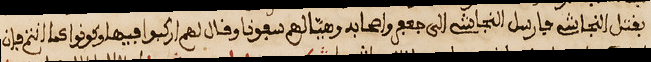بقتل النجاشى فارسل النجاشى الى جعفر واصحابه وهيا لهم سفونا وقال لهم اركبوا فيها وكونوا كما انتم فان
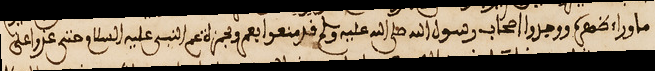ما وراء ظهره ووجدوا اصحاب رسول الله صلى عليه وسلم قد منعوا بعم وبخرة عم النبى عليه السلام حتى عزوا على
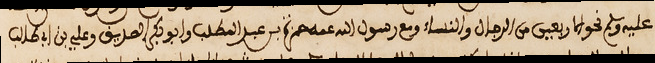عليه وسلم نحو الاربعين من الرجال والنساء ومع رسول الله عمه خمرة بن عبد المطلب وابو نكر الصديق وعلي بن ابى طالب
